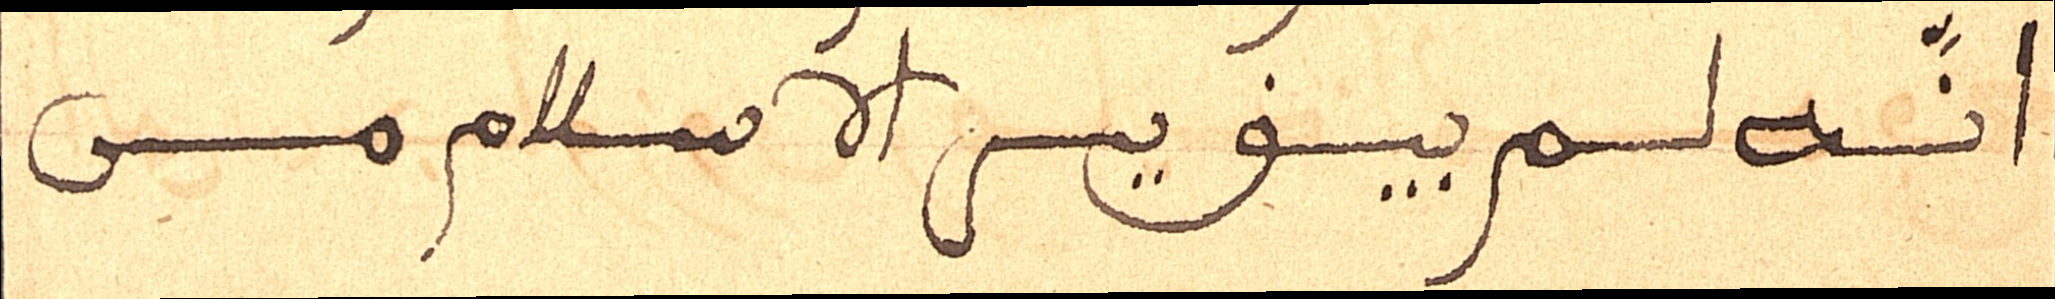انه لم بيق ير الا سلام من
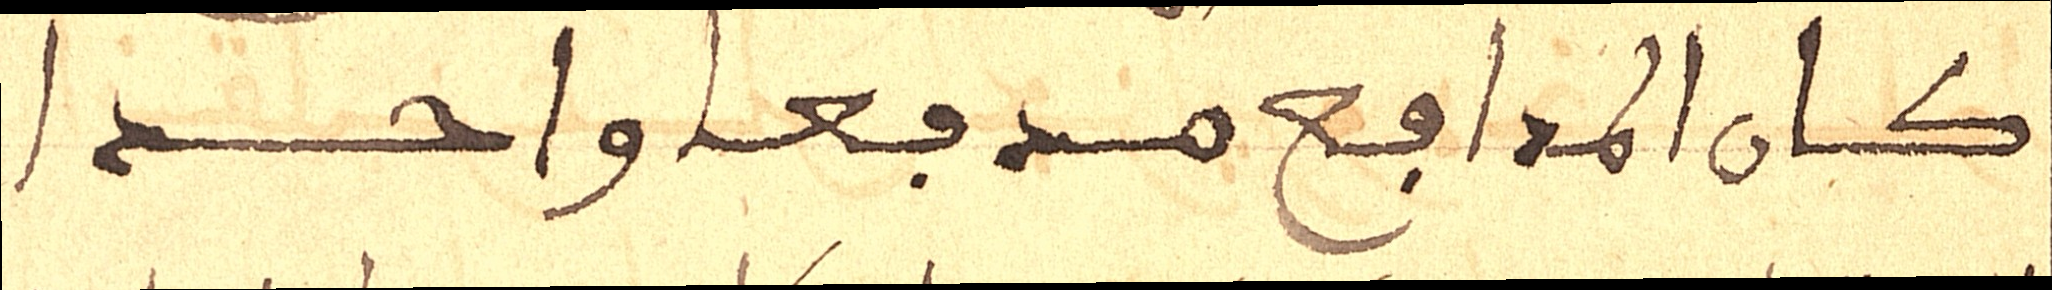كان المدافع مدفعا واحدا
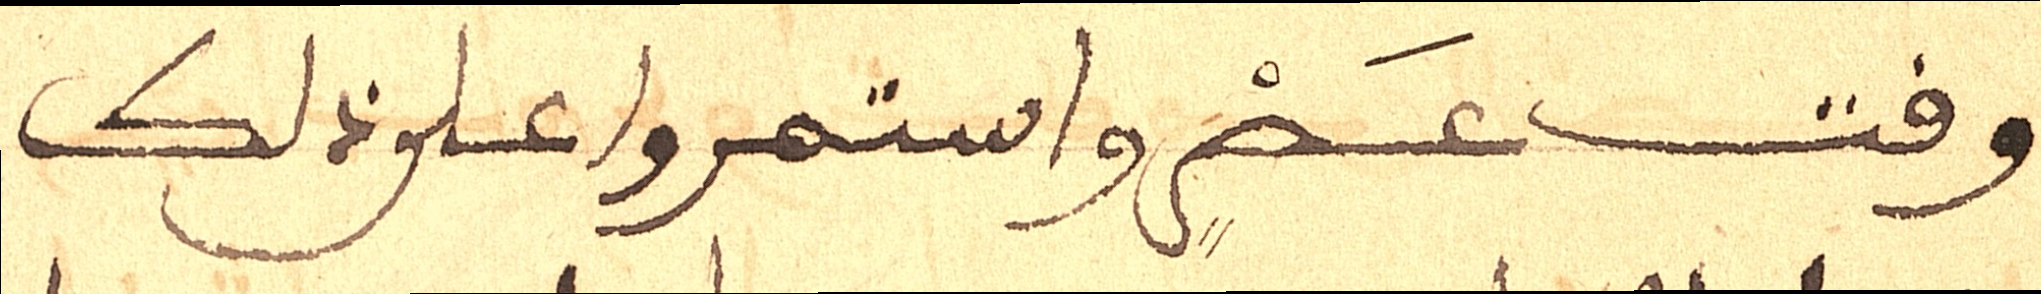وقت عصر واستمرو اعلى ذلك
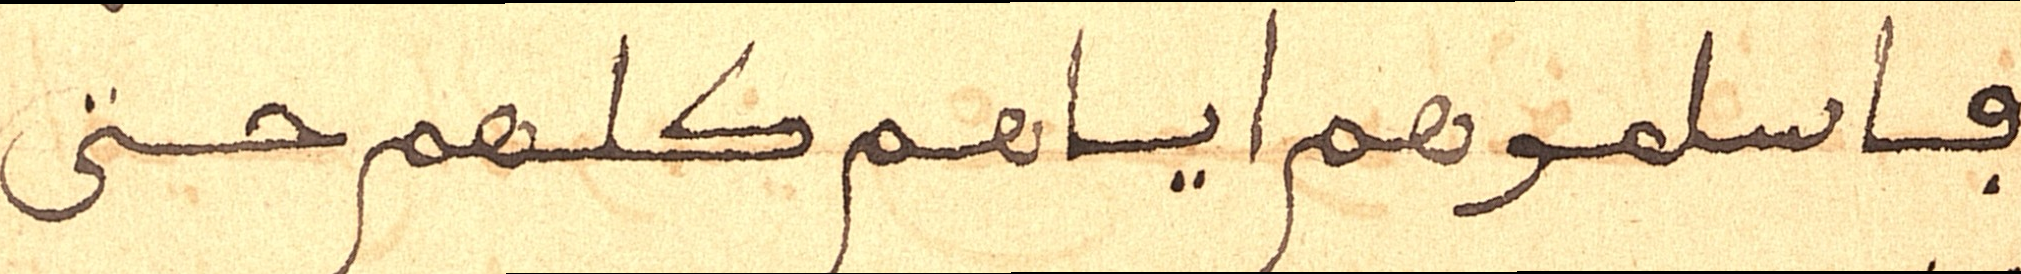فاسلموهم اياهم كلهم حتى
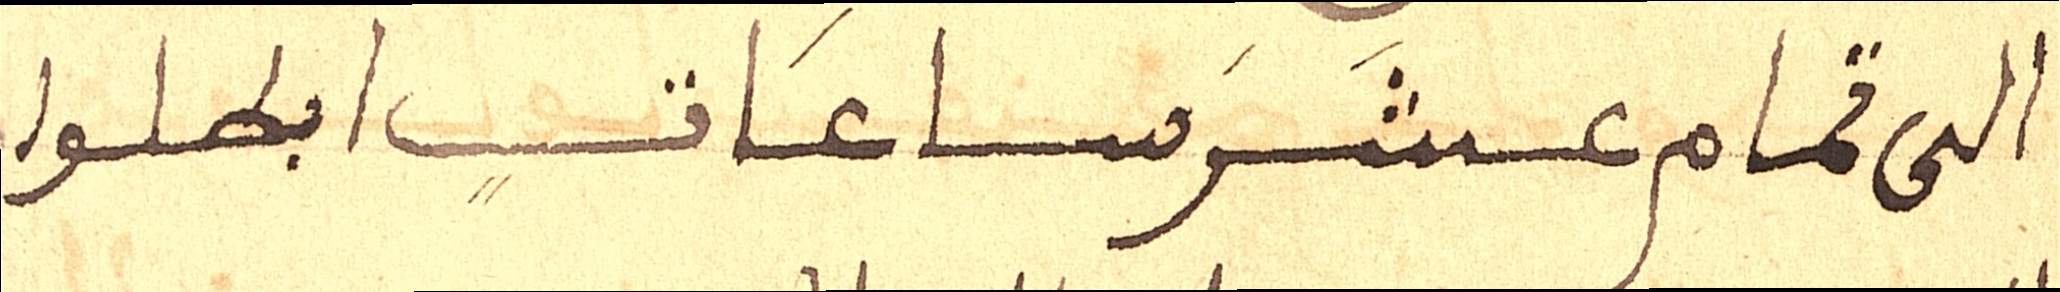الى تمام عشر ساعات ابطلوا
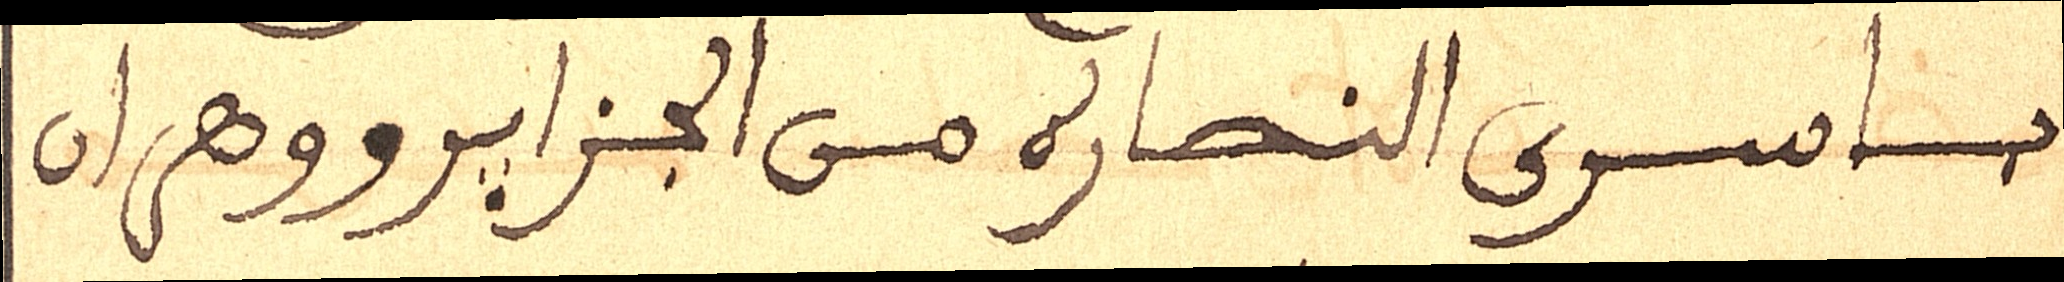باسرى النصاره من الجزائر ووهران
